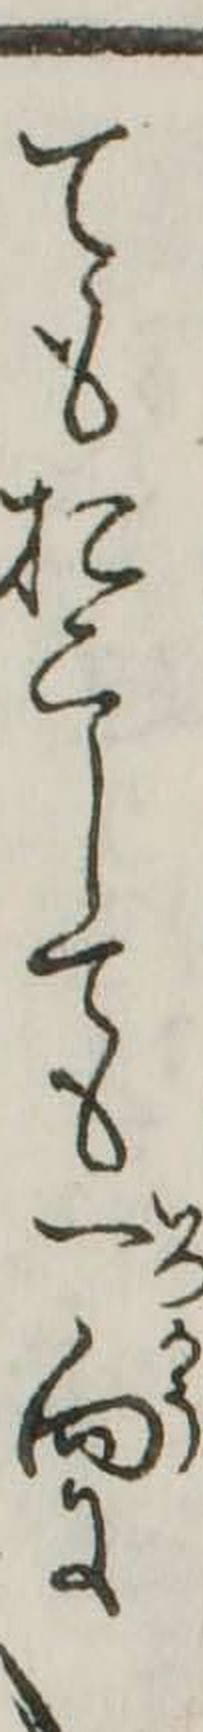てもおこしても一向に
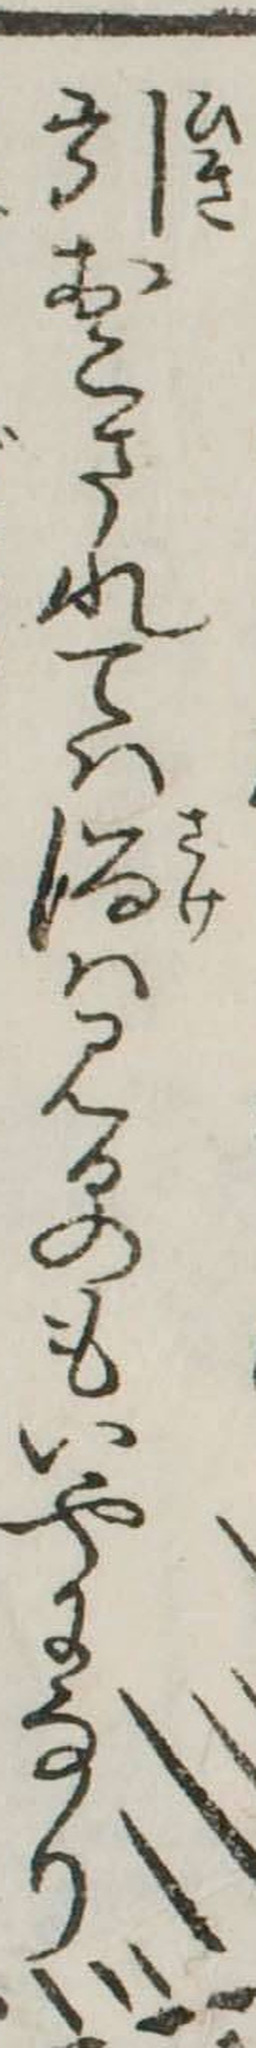引おこされては酒は見るのもいやになり
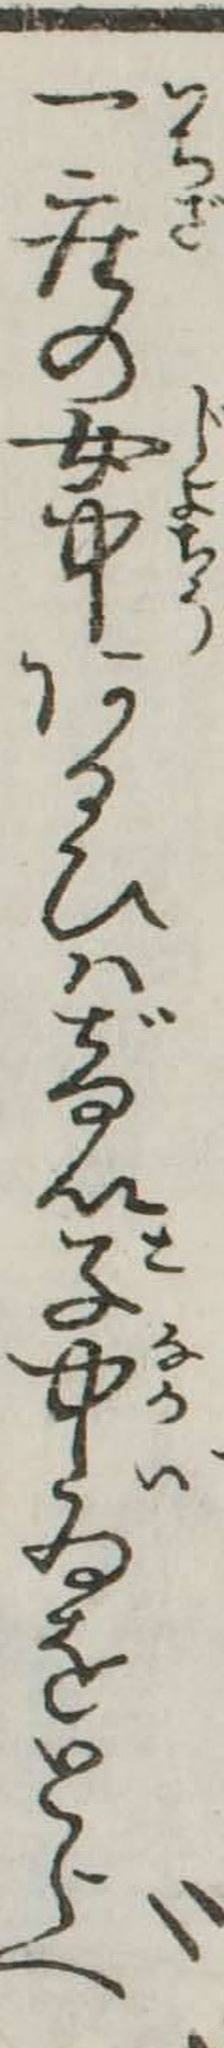一座の女中あるひはげい子中居をとらへ
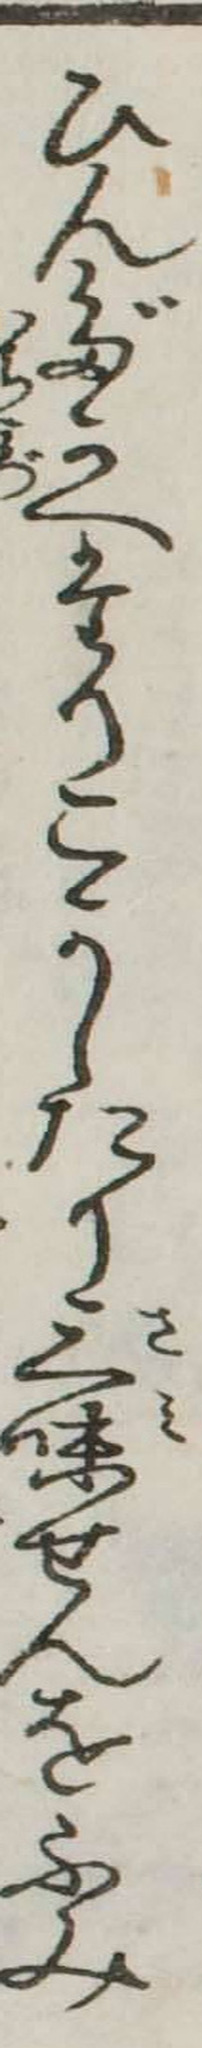ひんだかへたりこかしたり三味せんをふみ
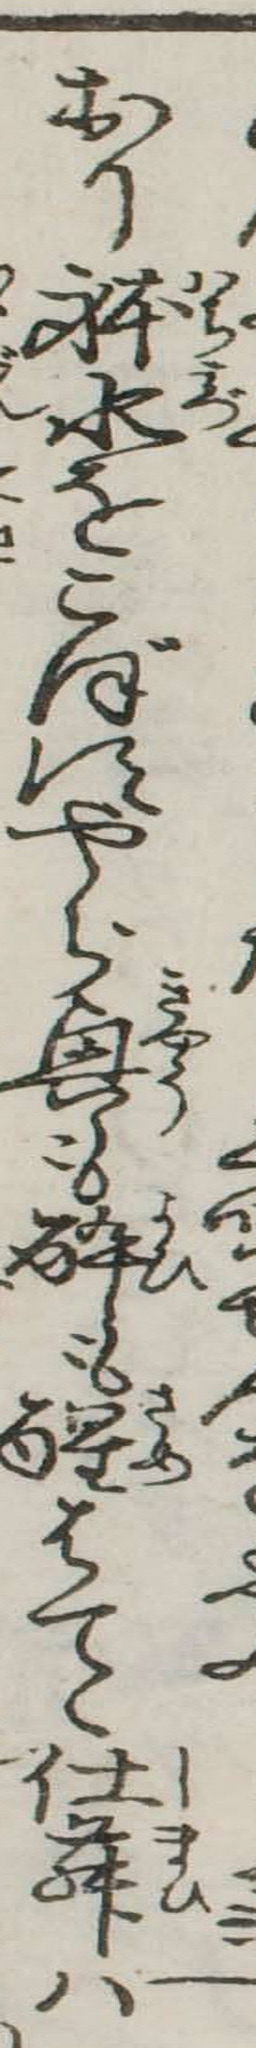おり鉢水をこぼすやら興も酔も醒はてゝ仕舞は
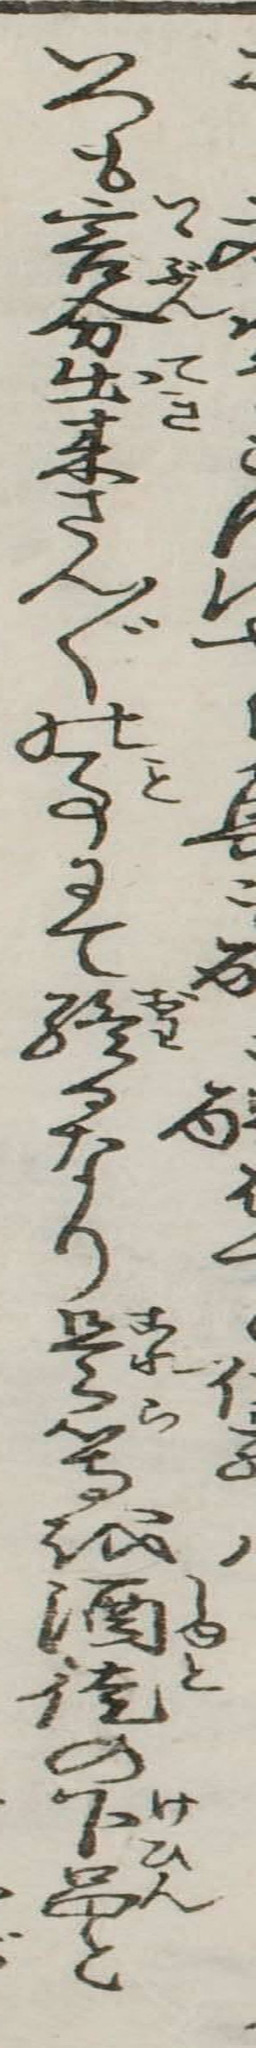いつも言分出来さん〴〵の事にて終るなり是等を酒徒の下品と
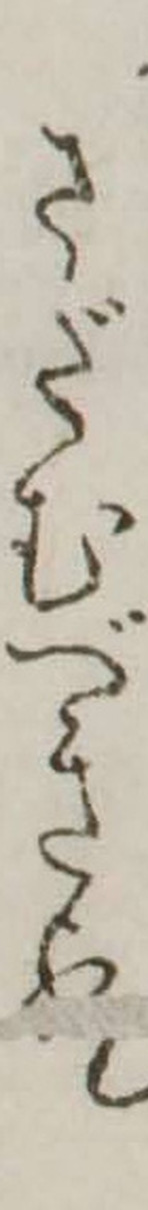さだむべき

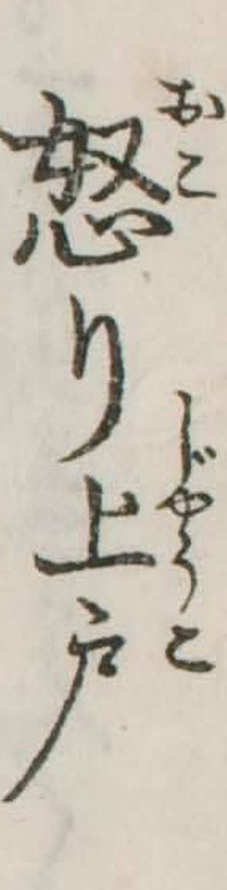怒り上戸
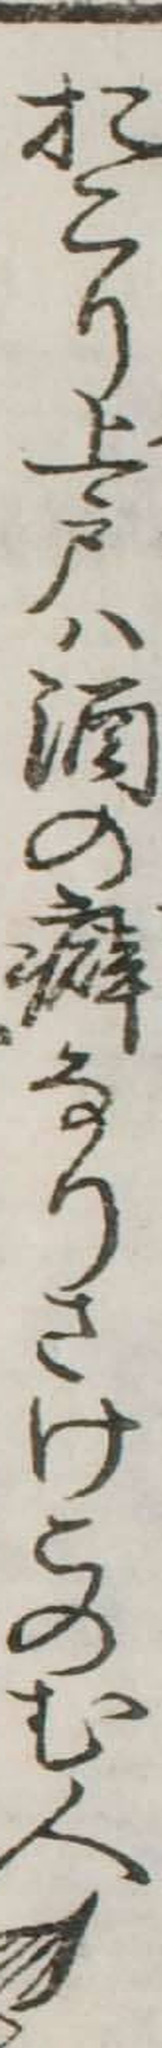おこり上戸は酒の癖なりさけこのむ人
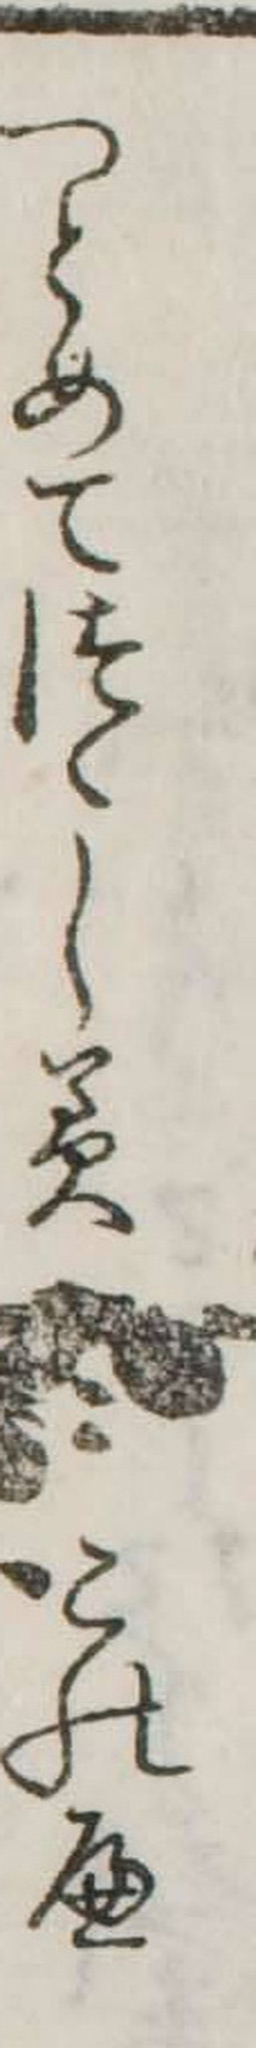つとめてつゝしみこのへ
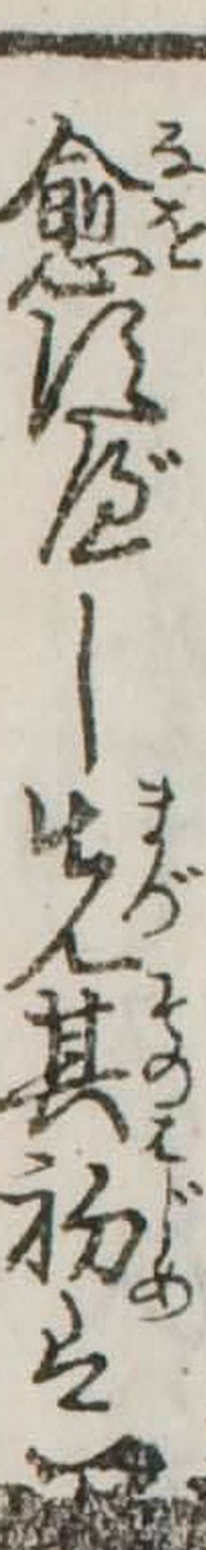愈すべし先其初は
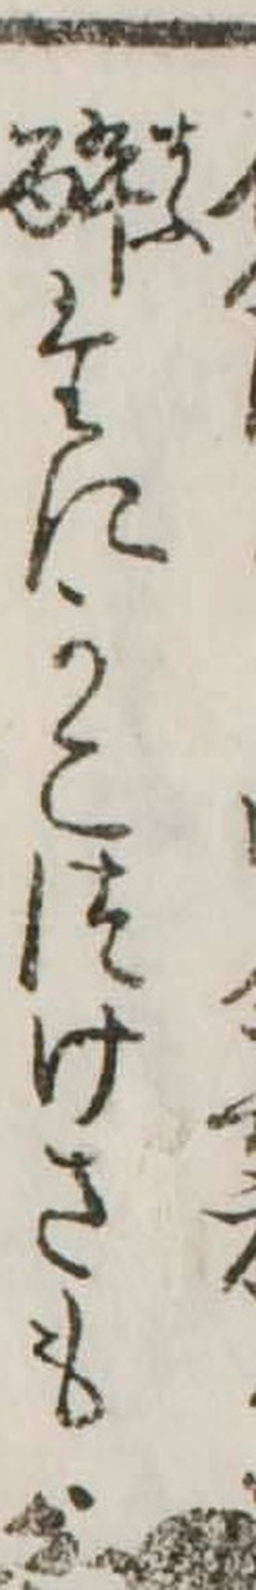酔たにかこつけさも
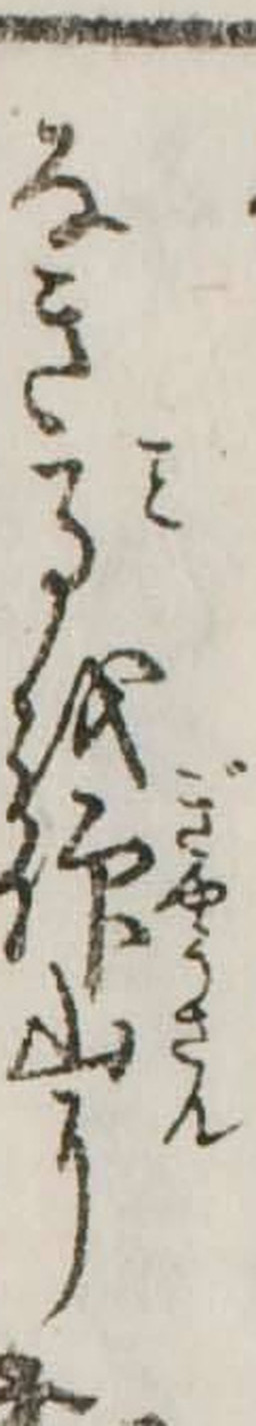なき事を仰山に
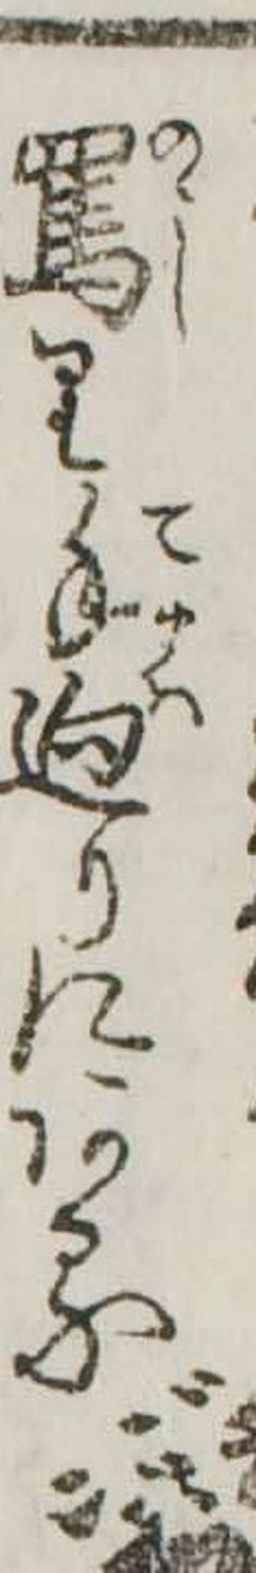罵り手廻りにある
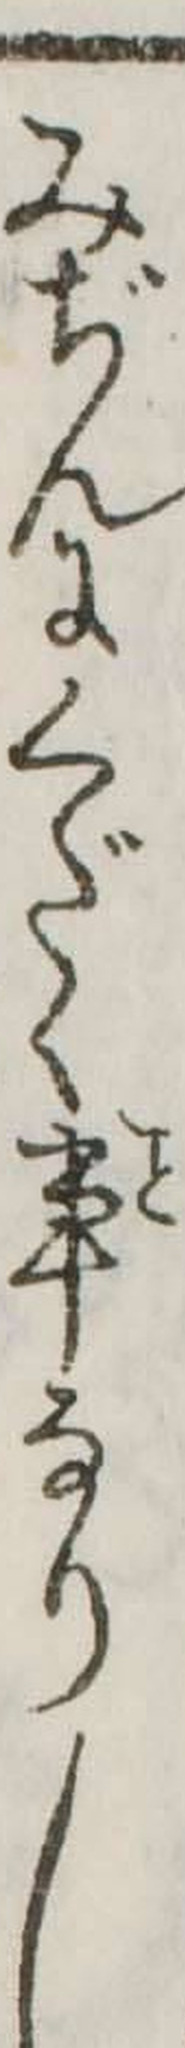みぢんにくだく事なり
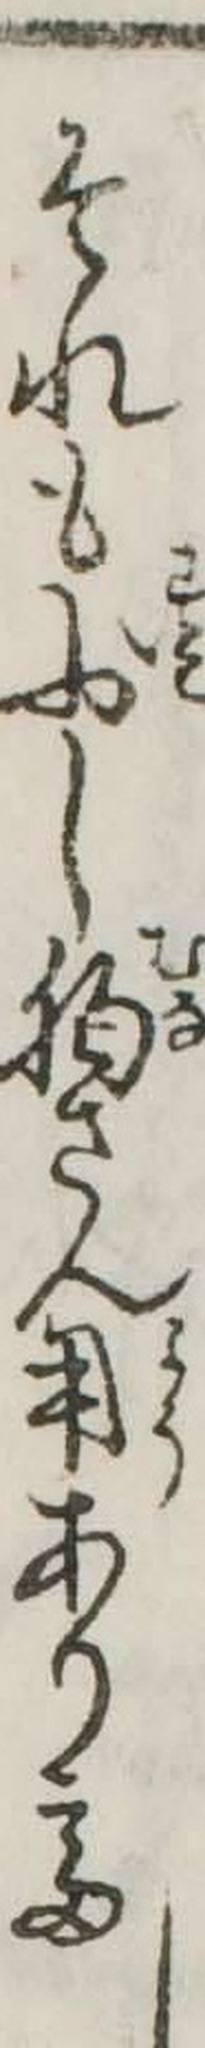それも少し胸さん用ありて
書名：繪本不盡泉
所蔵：国文学研究資料館
